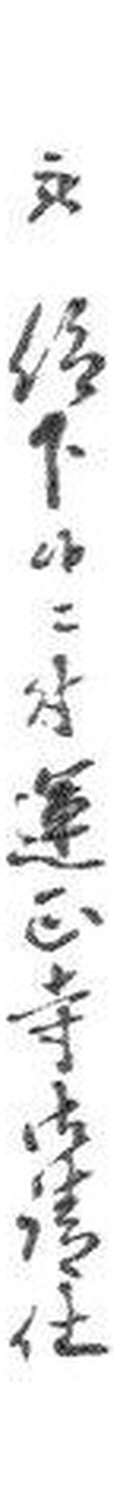被仰下候ニ付運正寺御請仕
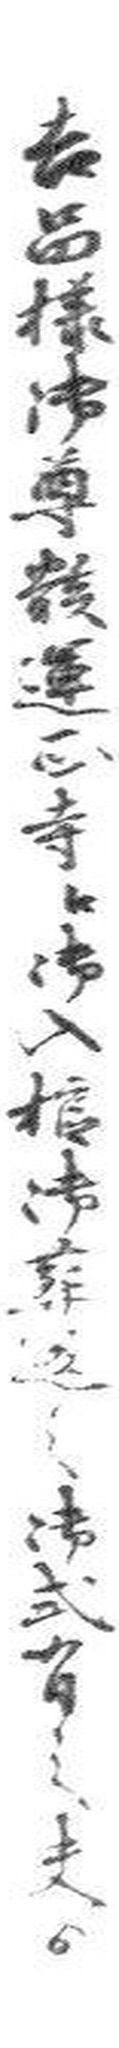吉品様御尊骸運正寺江御入棺御葬送之御式有之夫ゟ
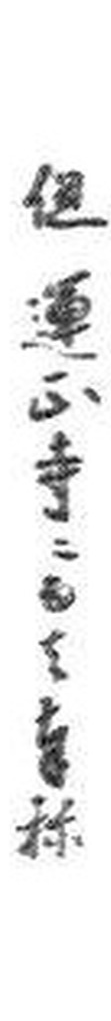但運正寺ニ而者奉称
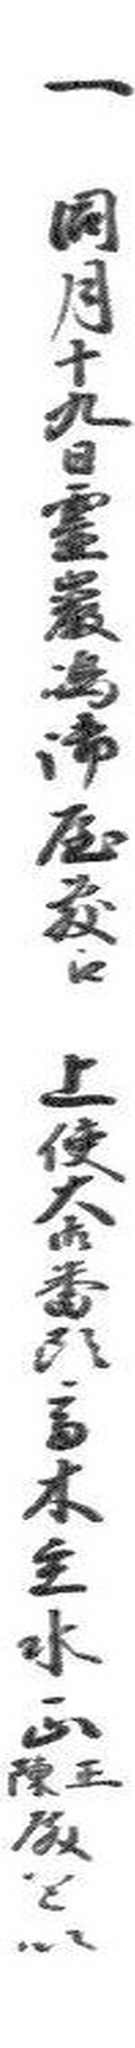一同月十九日霊巌島御屋敷江上使大御番頭高木主水正正陳殿を以
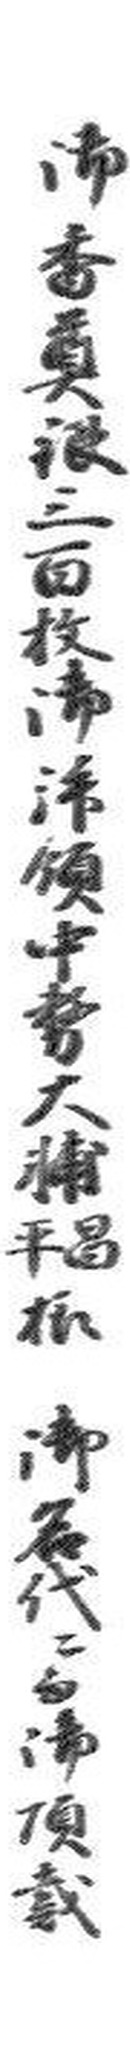御香奠銀三百枚御拝領中務大輔昌平様御名代ニ而御頂戴
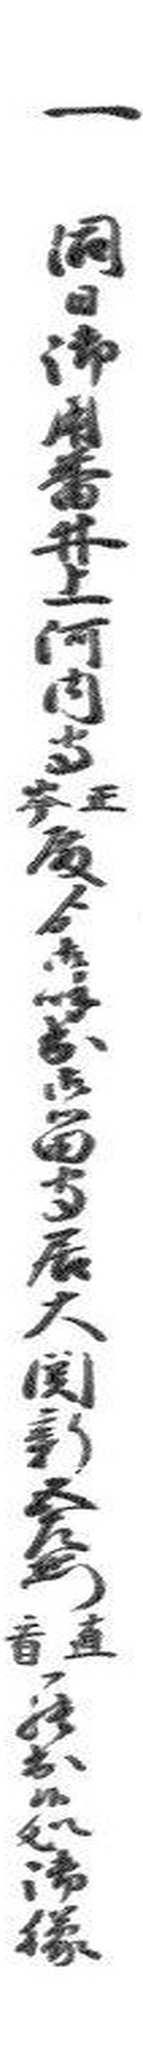一同日御用番井上河内守正岑殿ゟ御呼出御留守居大関新五左衛門直看罷出候処御朦
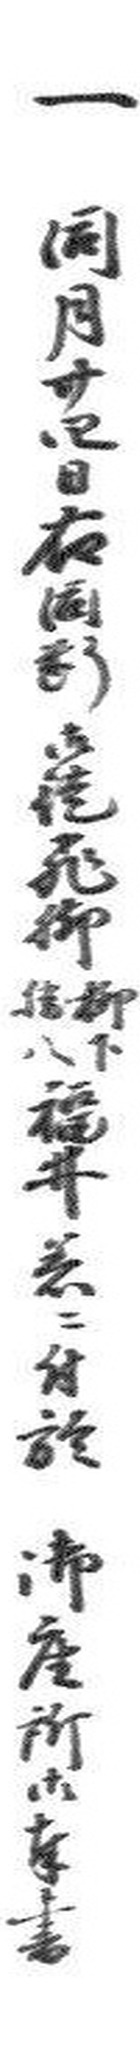一同月廿四日右同断御徒飛脚柳下勝八福井着ニ付於御座所御奉書
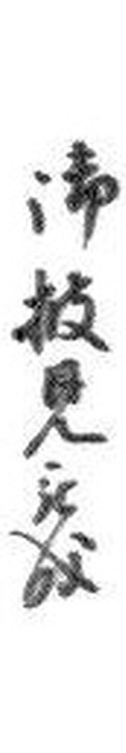御披見被成

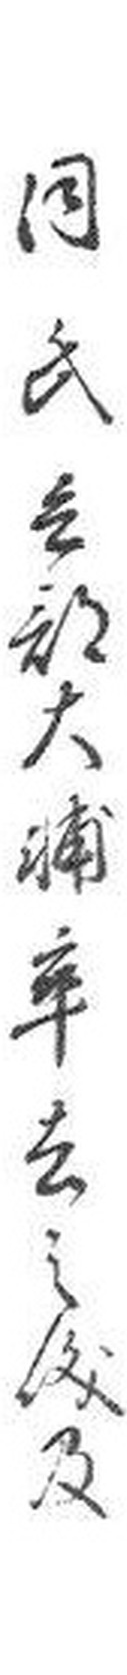同氏兵部大輔卒去之儀及
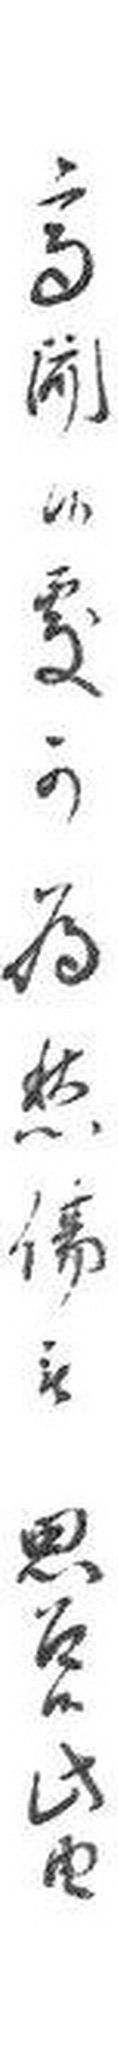高聞候処可為愁傷被思召候此由
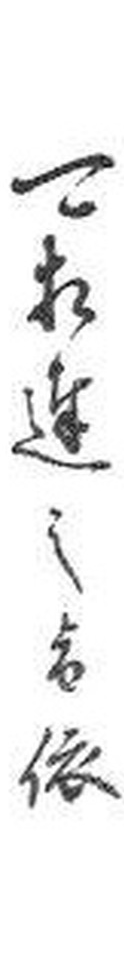可相達之旨依
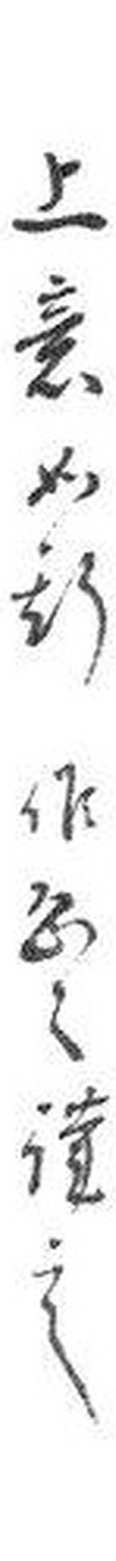上意如斯候恐々謹言
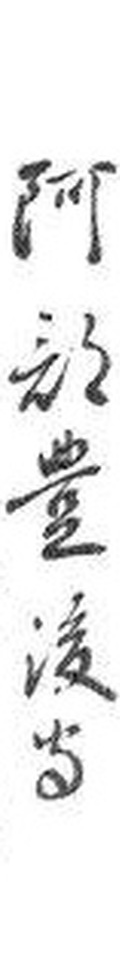阿部豊後守
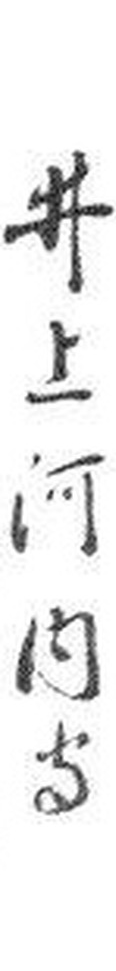井上河内守
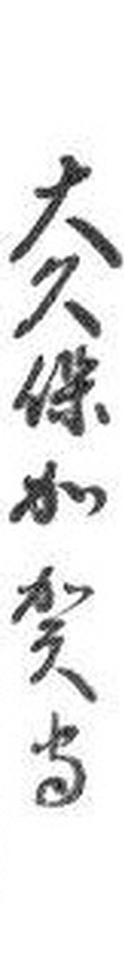大久保加賀守
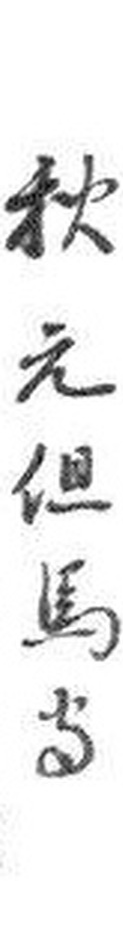秋元但馬守
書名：家譜 二十八 吉邦公 従宝永七年七月五日到正徳元年十二月
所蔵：福井県文書館 Fukui Prefectural Archives
